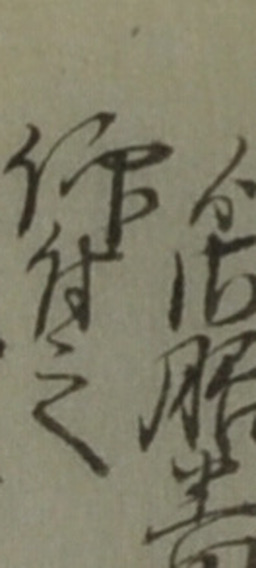仰付之
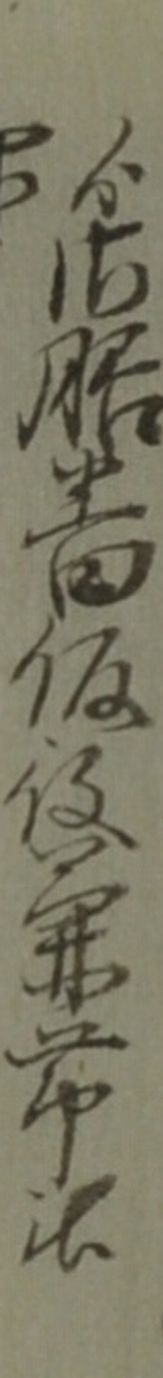ゟ御膳番仮役兼帯被
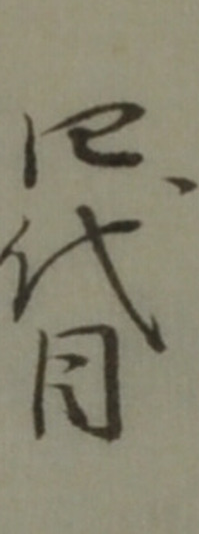四代目
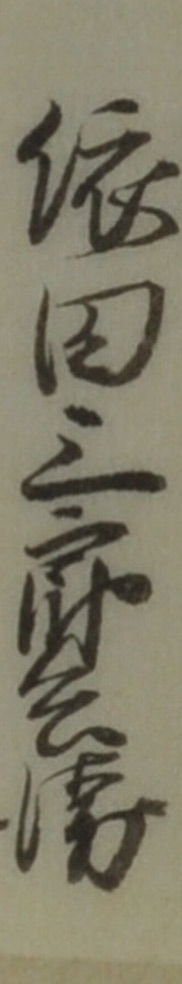依田三郎兵衛
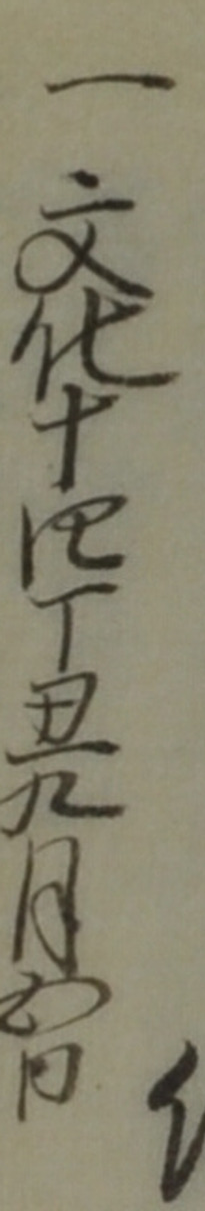一文化十四丑九月五日
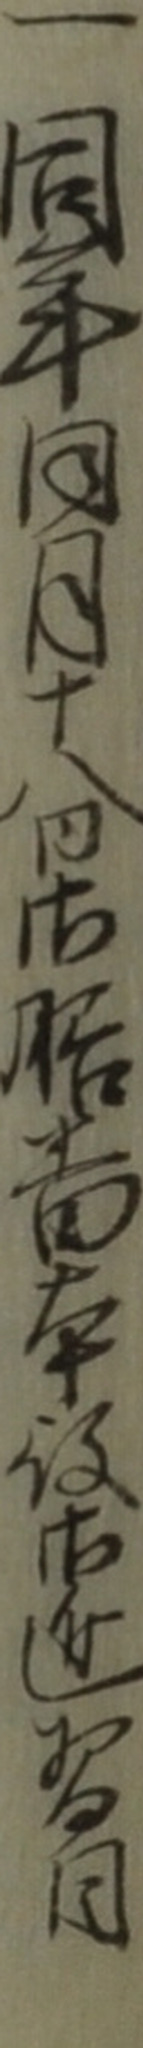一同年同月十八日御膳番本役御近習目
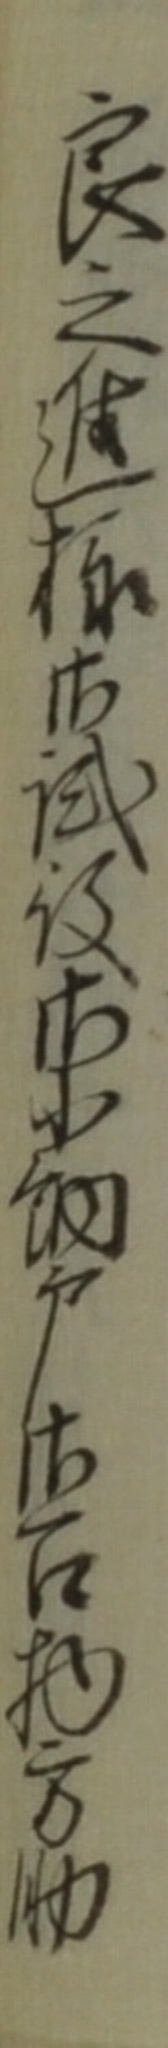良之進様御試役御小納戸御召物方助
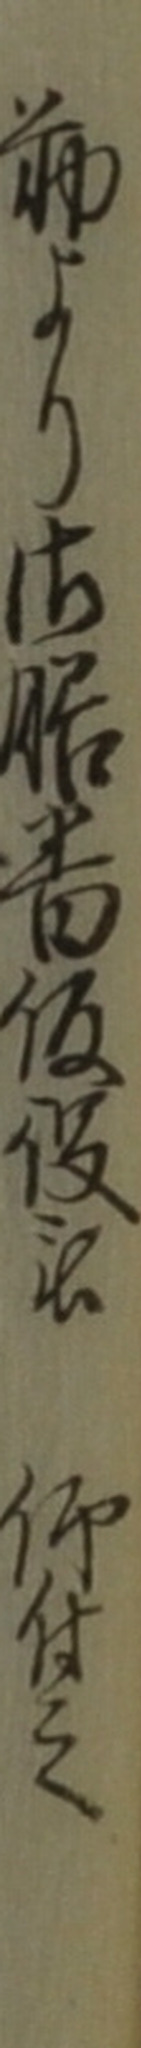勤より御膳番仮役被仰付之
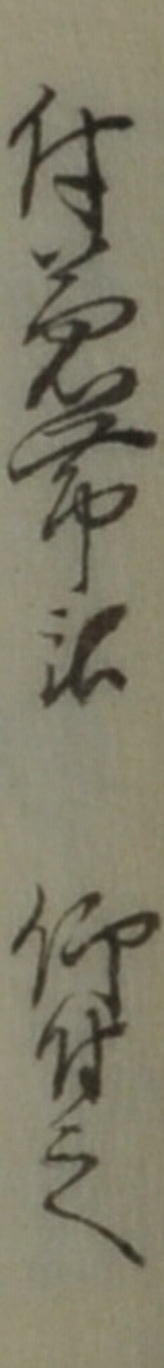付兼帯被仰付之
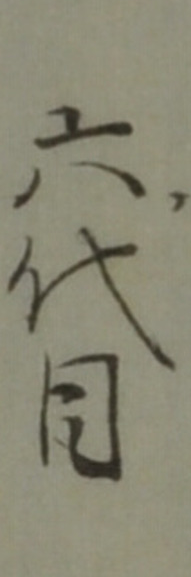六代目
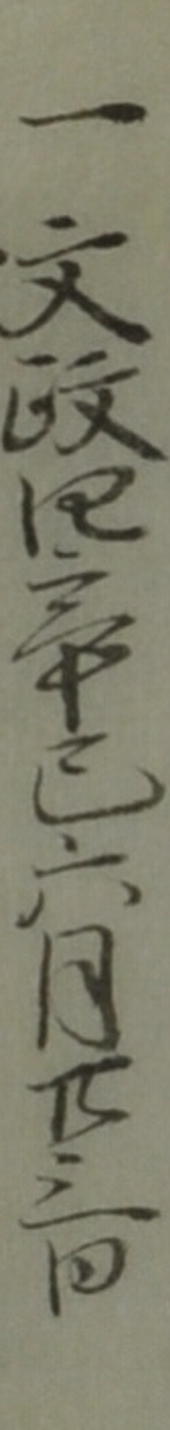一文政四辛巳六月廿三日
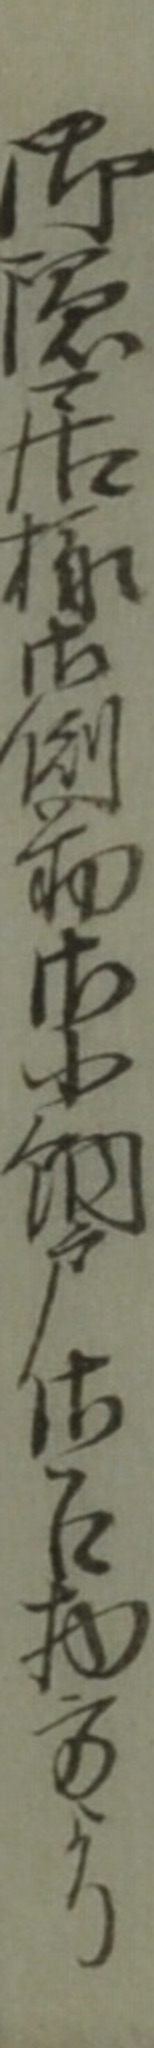御隠居様御側勤御小納戸御召物方より
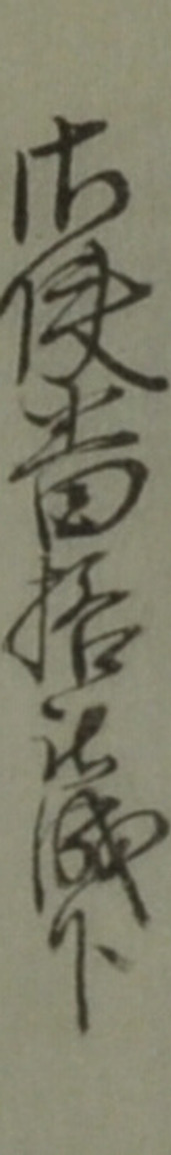御使番格被成下
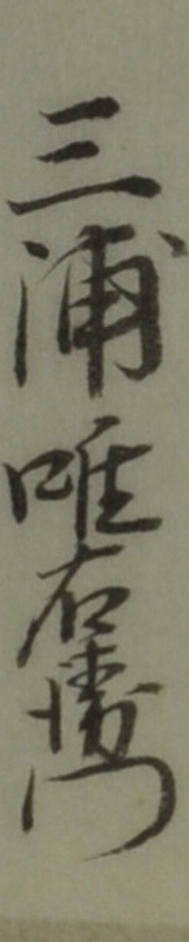三浦唯右衛門
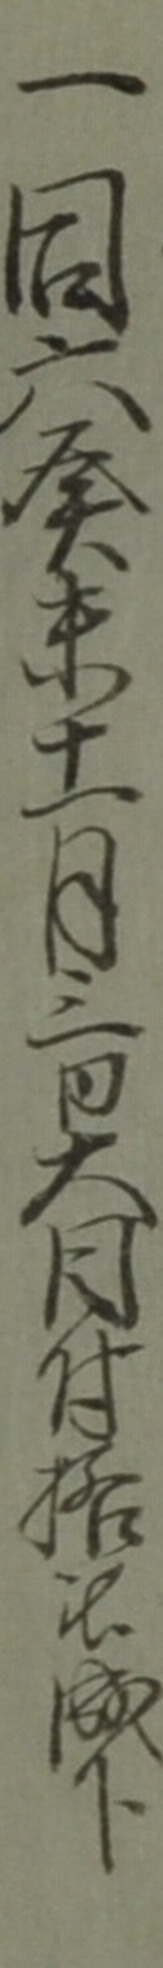一同六癸巳十一月三日大目付格被成下
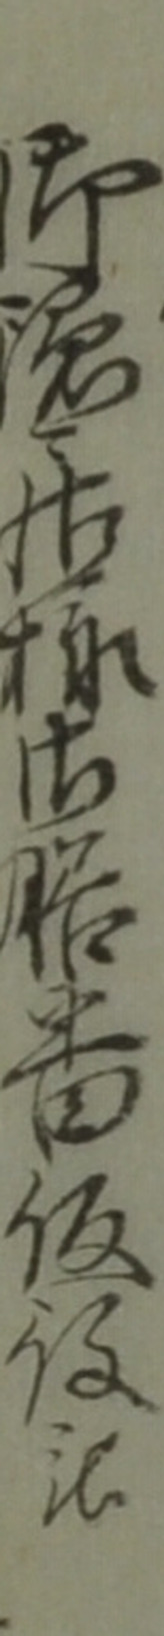御隠居様御膳番仮役被
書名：諸御役代々録（四）
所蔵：伊那市立高遠町図書館・合同会社AMANE
